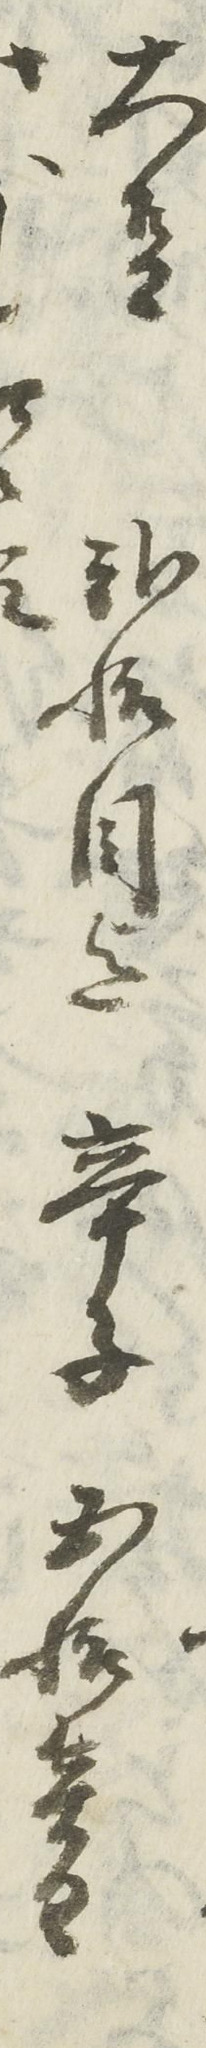大麦弐拾目迄辛子五拾壱匁
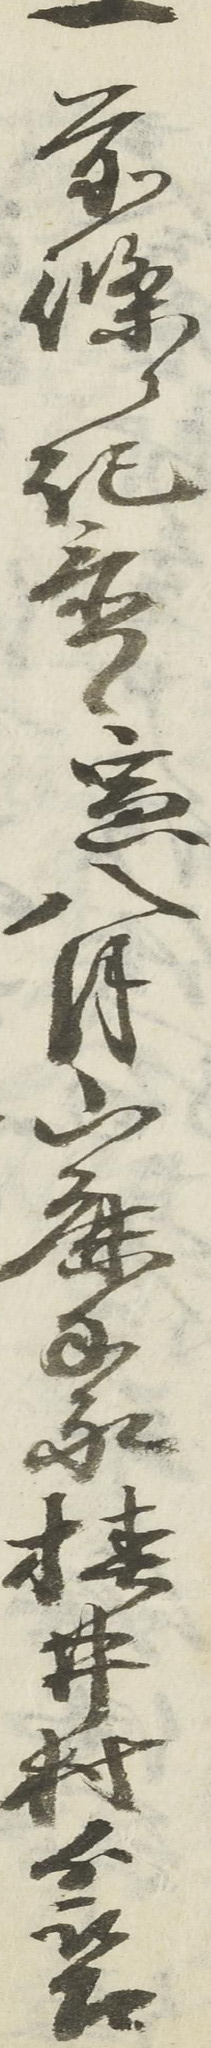一前条ニ記置候寅八月山鹿手永桂井村ゟ被召
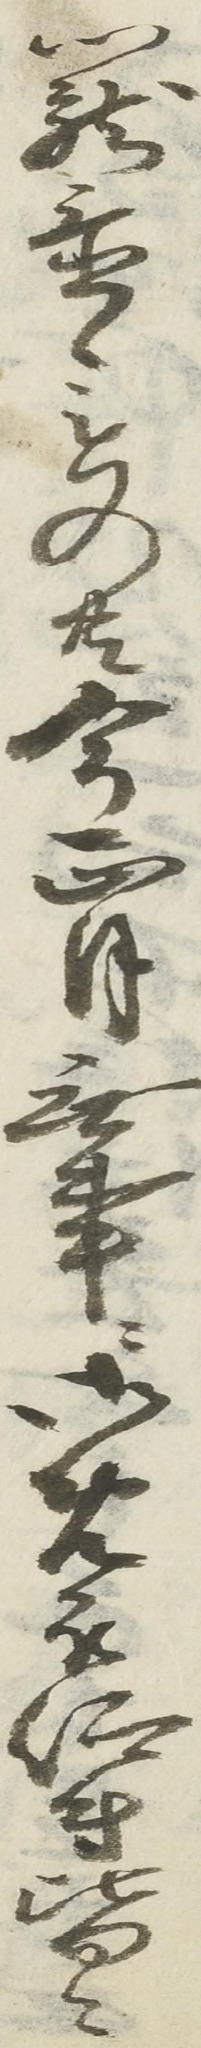寵置候もの共今正月無事ニ御免被仰付皆々
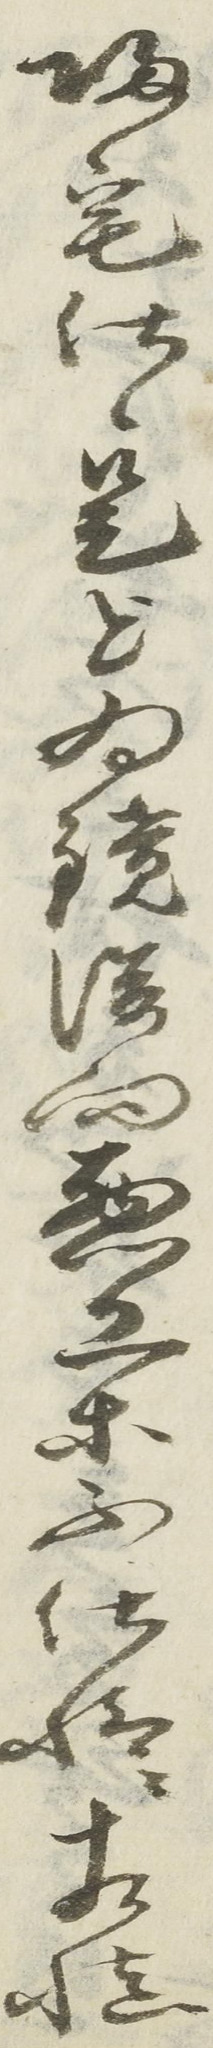帰宅仕候是を為鏡後向悪工等不仕様ニ相慎
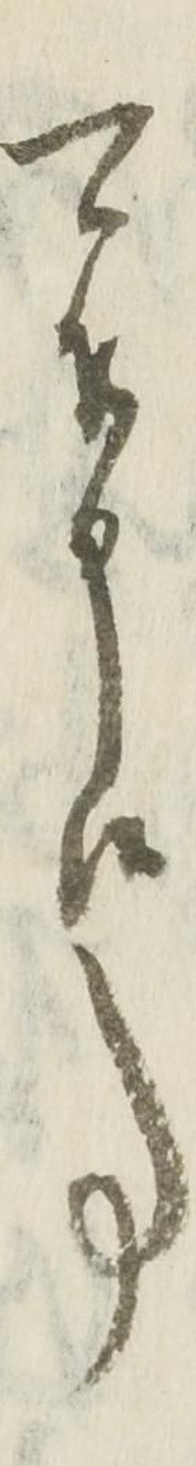可被申候事
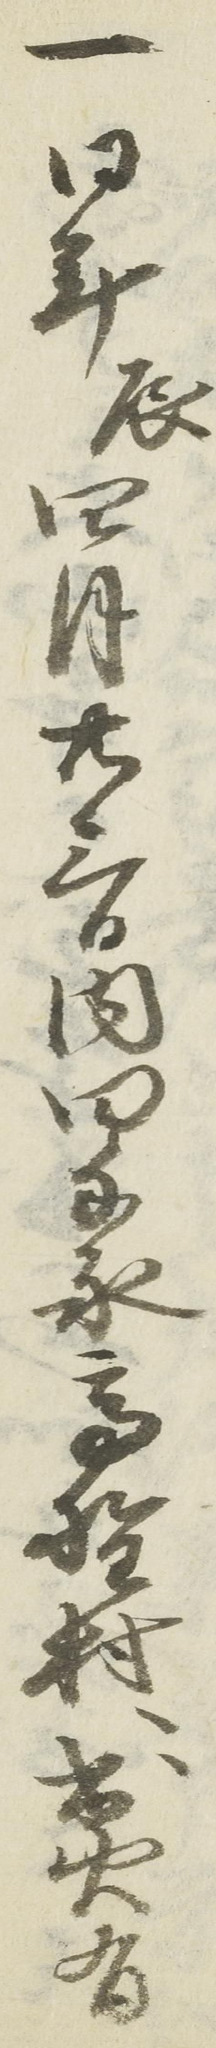一同年辰四月廿三日内田手永高野村へ出火有
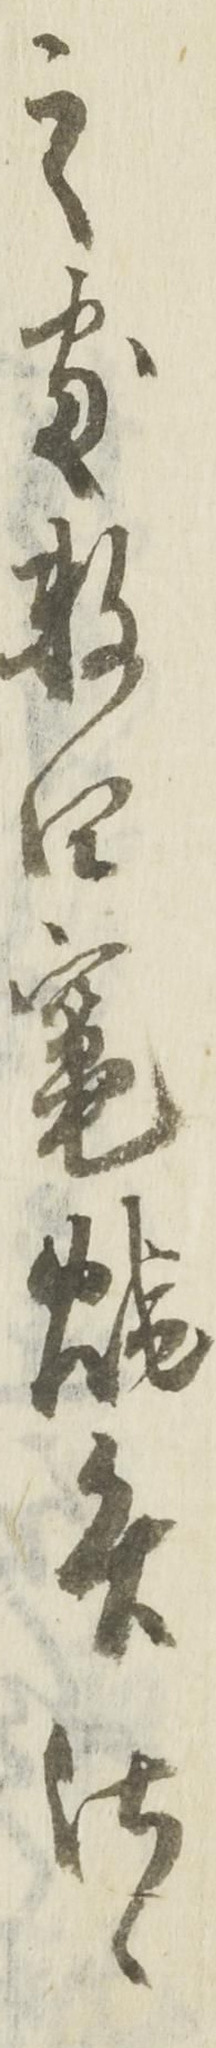之家数四竃焼失仕候
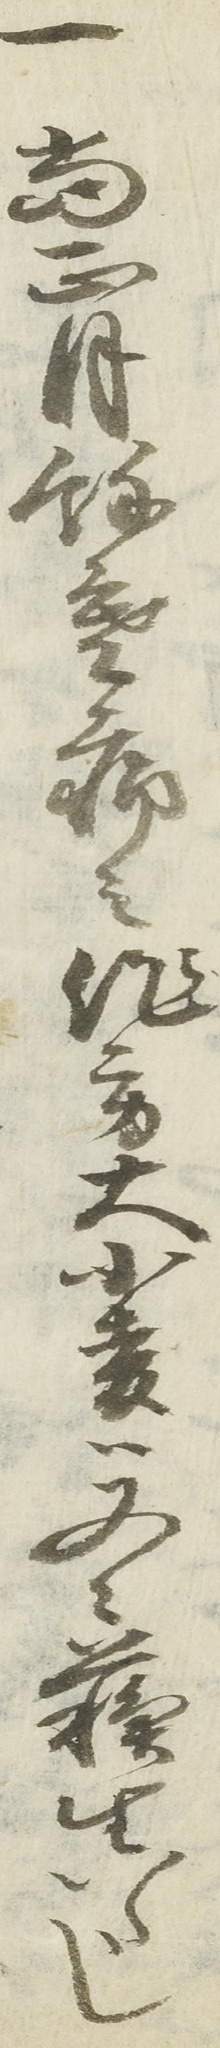一当正月餘寒痛み作方大小麦は又々薄生いたし
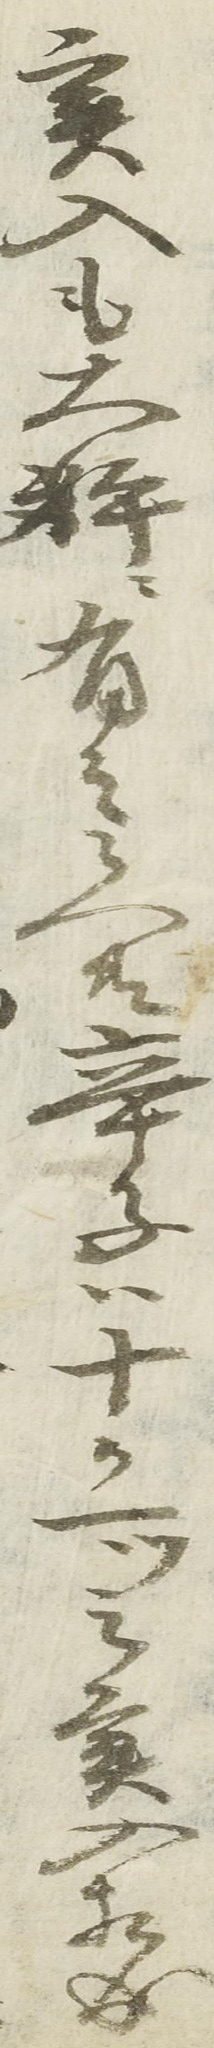実入も大躰ニ有之候へ共辛子は十か一ツ之実入相成
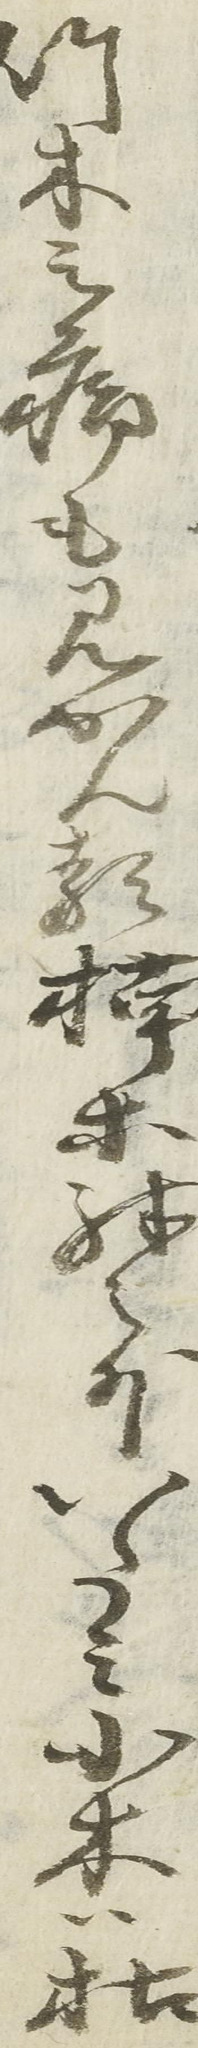竹木之痛もみかん類楠等殊之外いたみ小木は枯
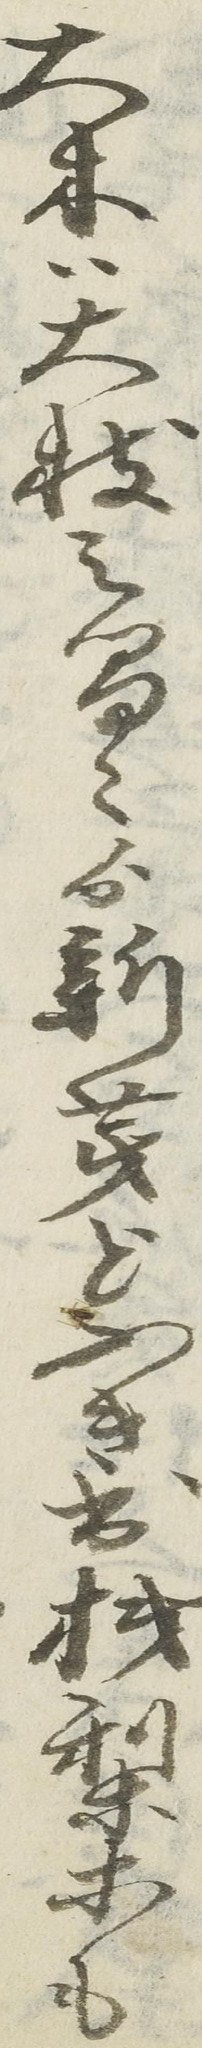大木は大枝之間々ゟ新芽をふき出梯梨等も
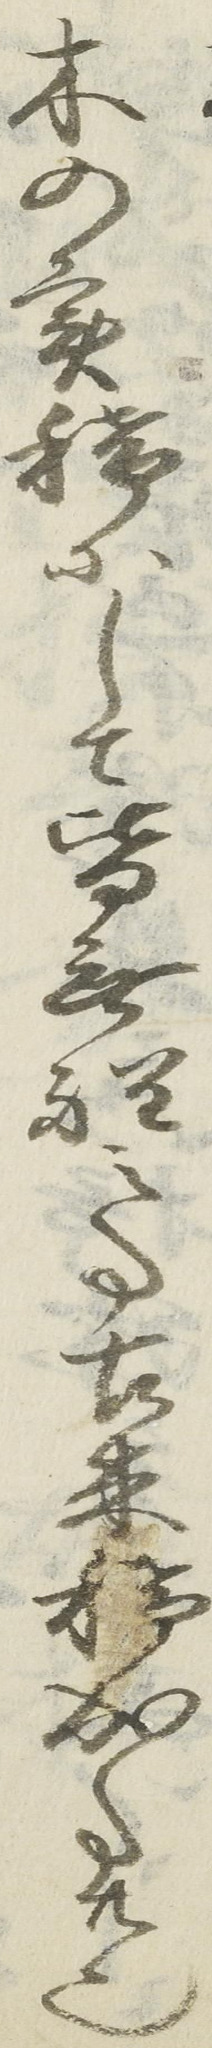木の実稀にして皆無程之事古来稀成事共也
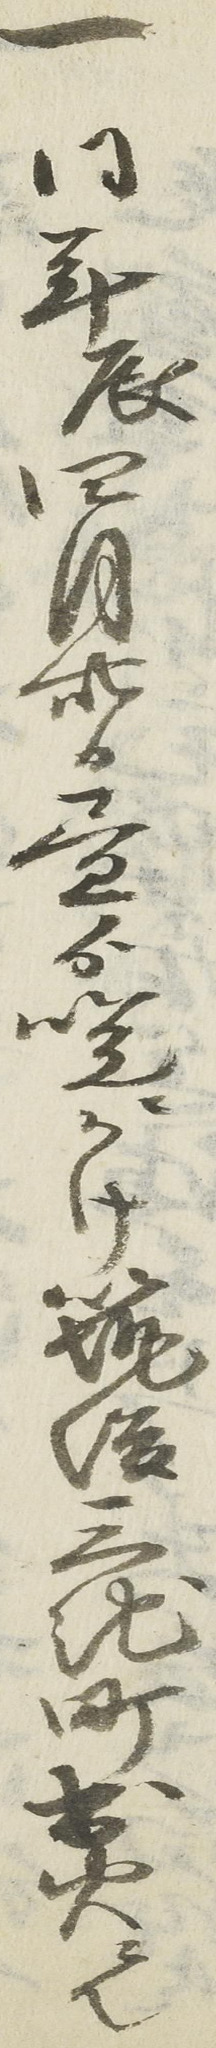一同年辰四月丗日昼ゟ晩ニかけ筑後三池町出火ニて
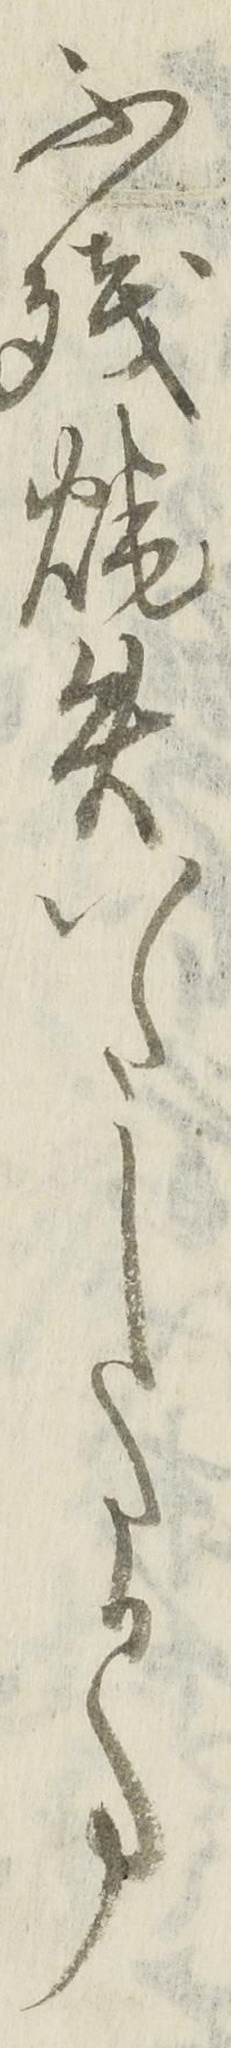不残焼失いたし候事
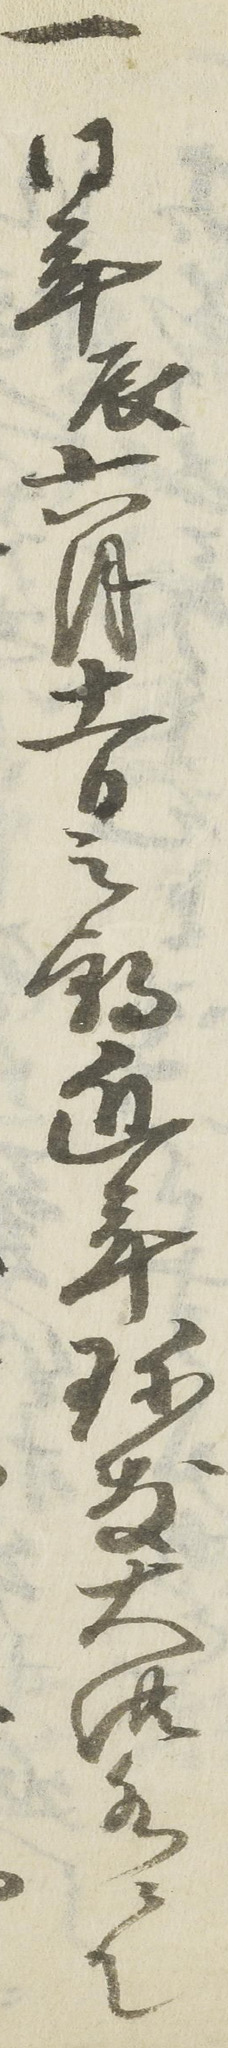一同年辰六月十一日之朝近年珍敷大洪水ニて
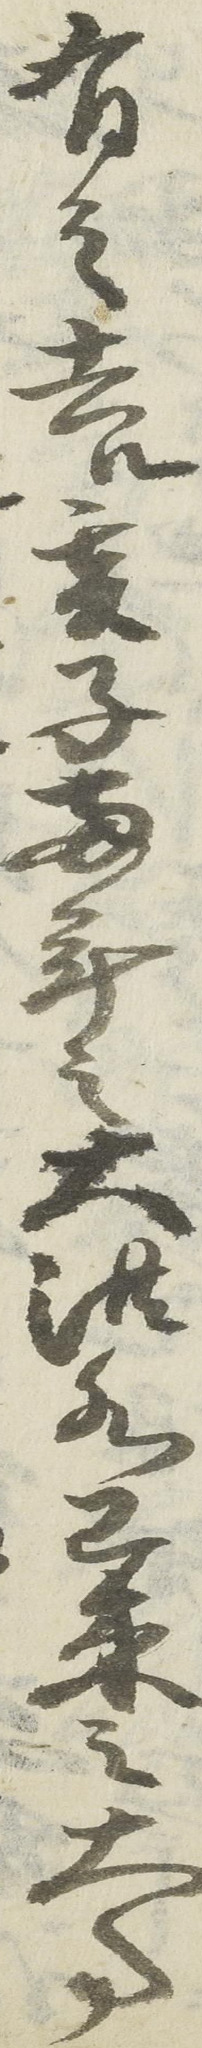有之去ル亥子両年之大洪水己来之大事
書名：後見笑
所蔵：東京大学地震研究所図書室 Earthquake Research Institute Library, The University of Tokyo, JAPAN
